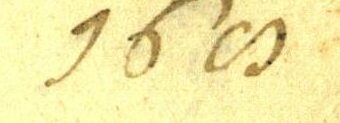168
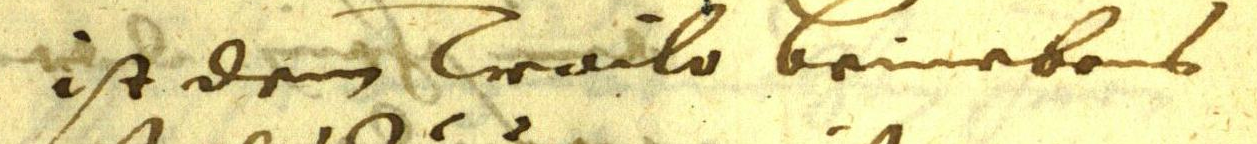ist dem Troilo beinebens
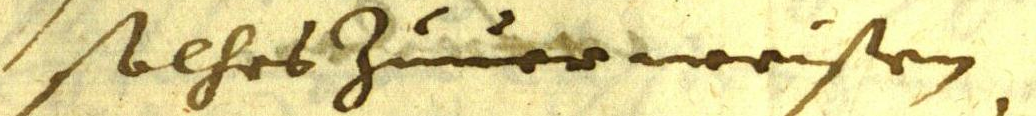solhes Zūūerweisen.
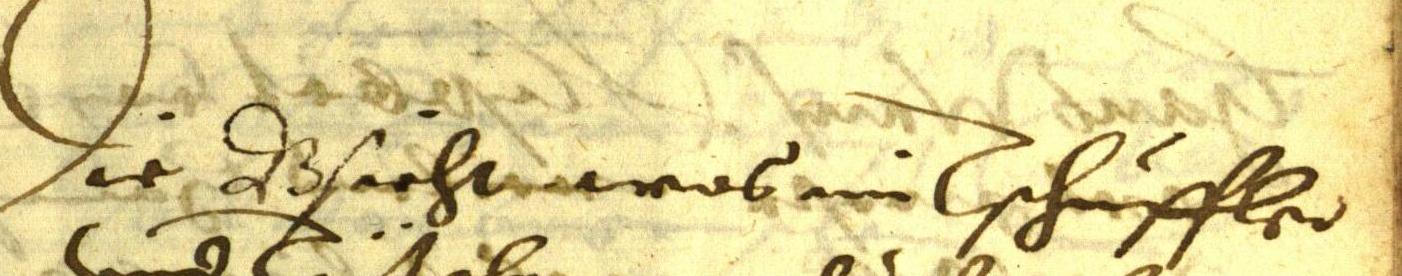Die Bsicht. was im Tschūffler
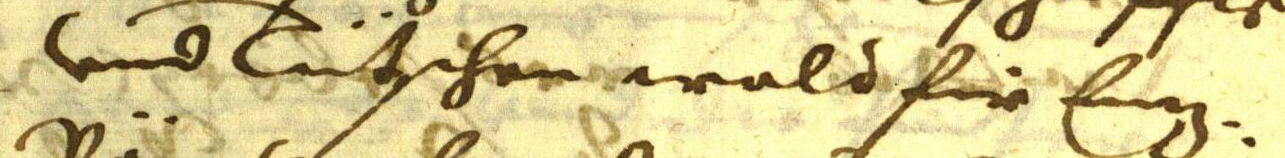vnd Tütscher wald fir Enz¬
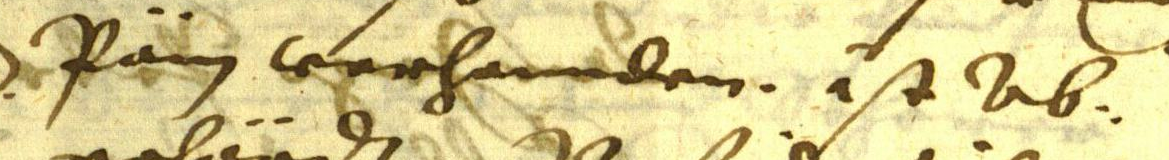Päm verhanden. ist Ab¬
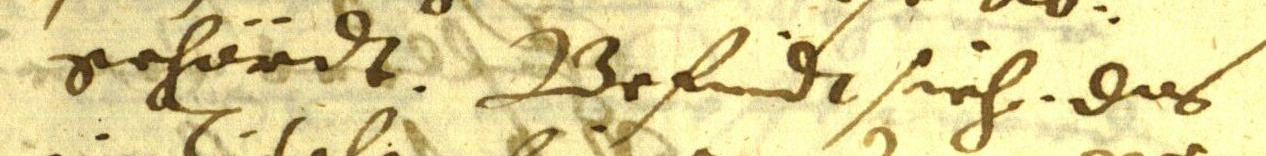gehördt. Befindt sich. das
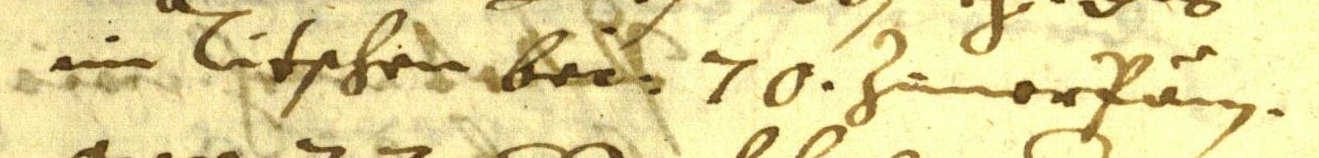im Titschen bei: 70. Zimerpām.
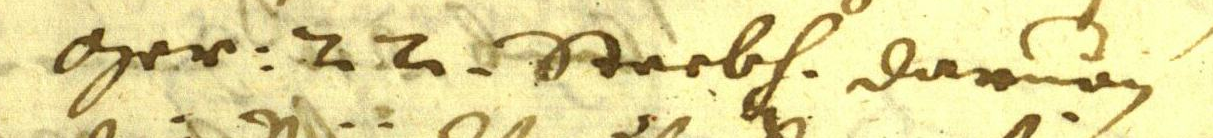Mer: 22 Steckh. darvon
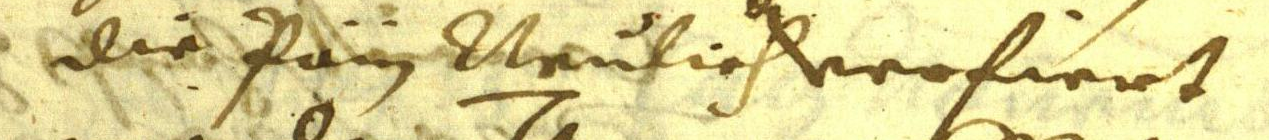die Päm Neūlich verfiert
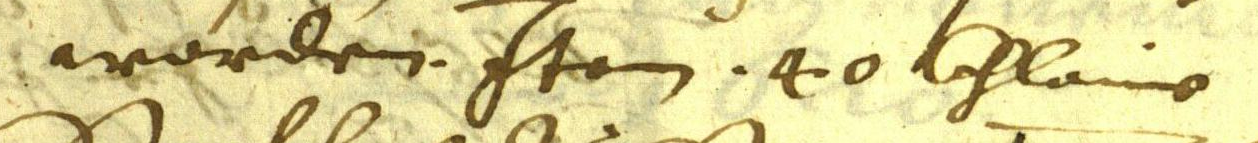worden. Item. 40 khlaine
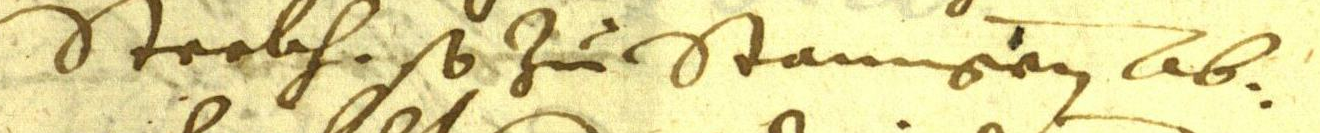Steckh. so Zū Stanngen Ab¬
